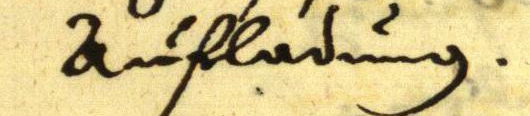Aūfladūng.
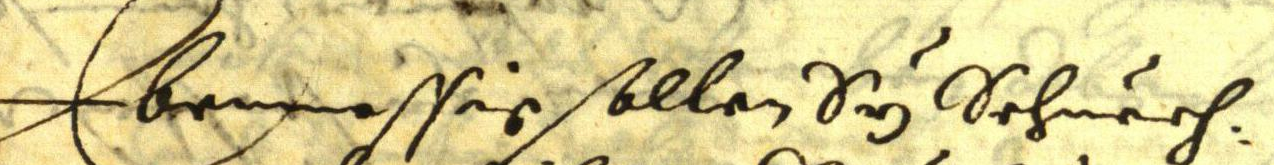Ebenmessig sollen Sȳ Schūech¬
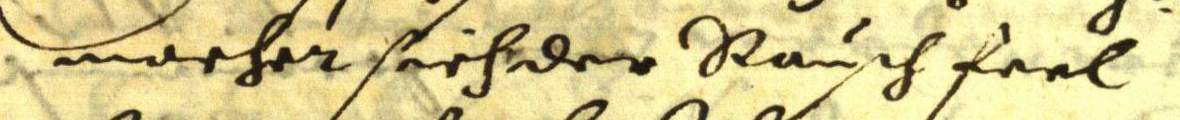macher sich der Raūsch feel
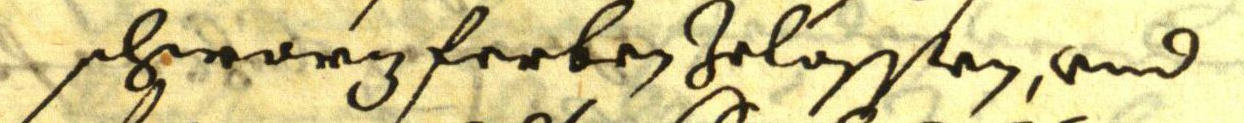schwarz ferben Zelassen, vnd
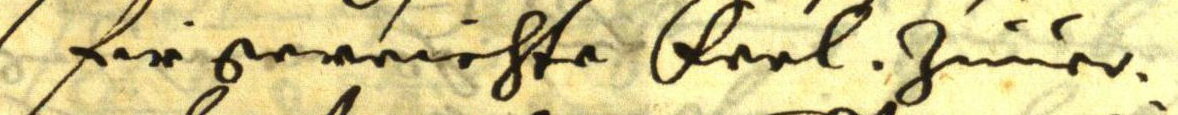fir gereichte Feel. Zūūer¬
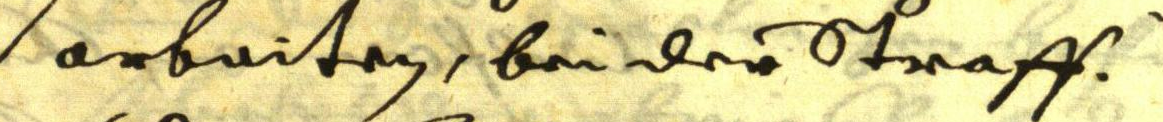arbaiten, bei der Straff.
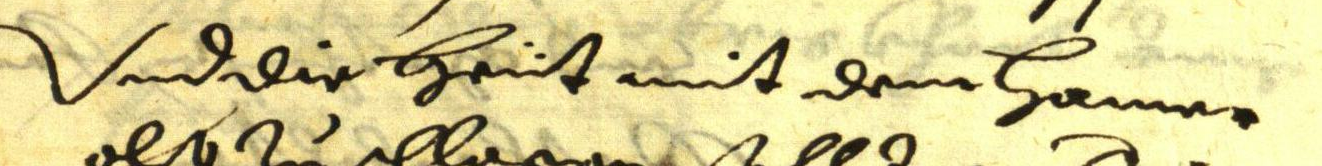Vnd die Heüt mit dem Hamer
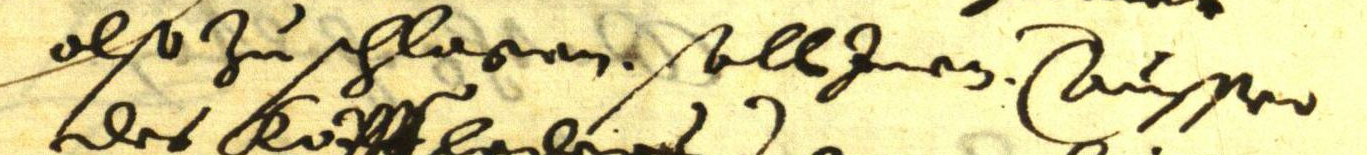also Zū schlagen. soll Inen. (Aūsser
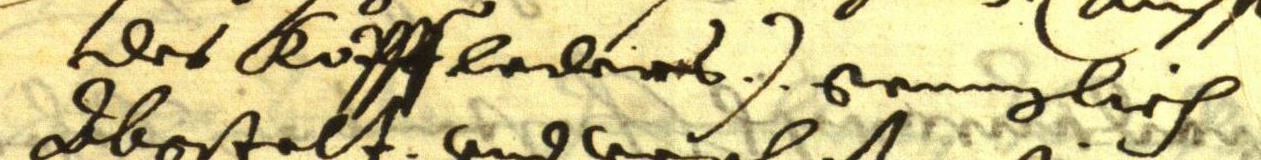des Kopfs leders.). gennzlich
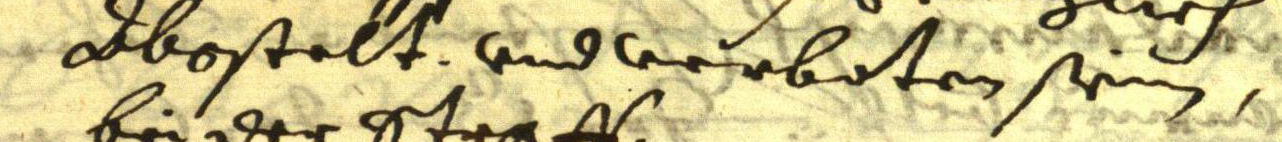Abgstelt. vnd verboten sein,
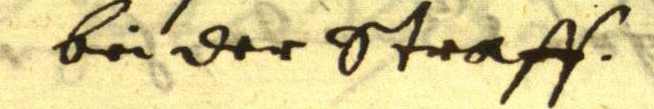bei der Straff.
